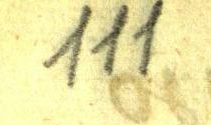111
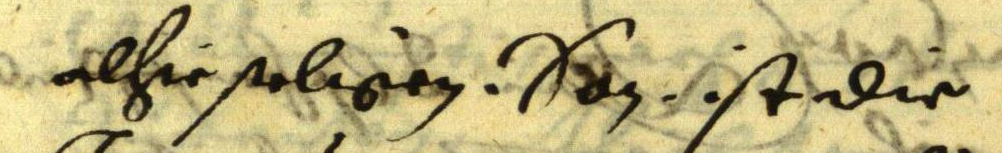alhie seligen. Son. ist die
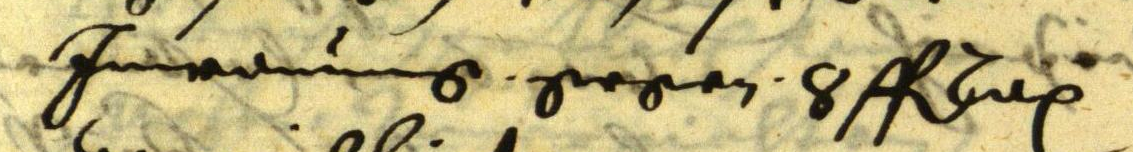Inwonūng. gegen. 8 fl Tax
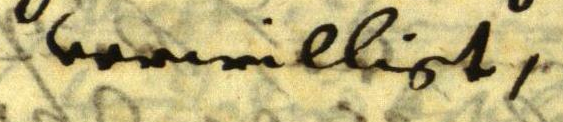verwilligt,
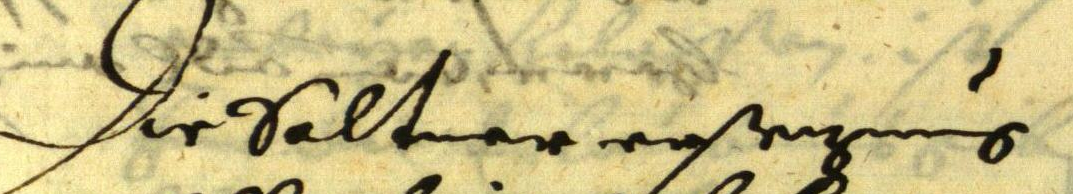Die Saltner ersezūng
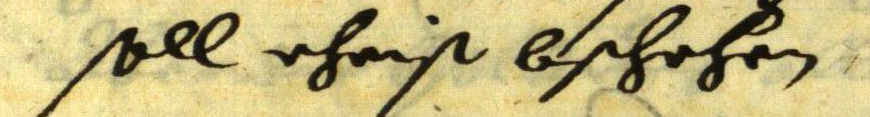soll eheist bschehen
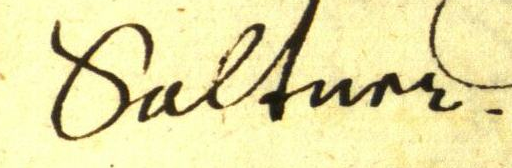Saltner.
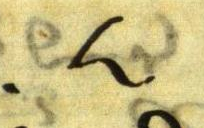t
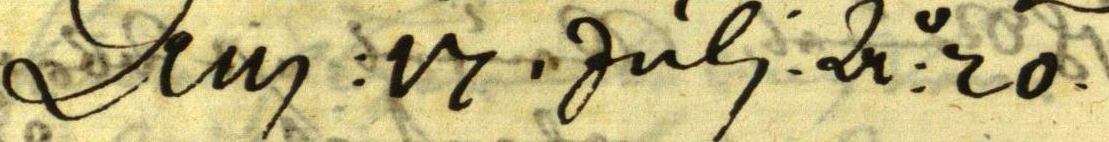Am: 17. Jūlj. Ao: 20.t
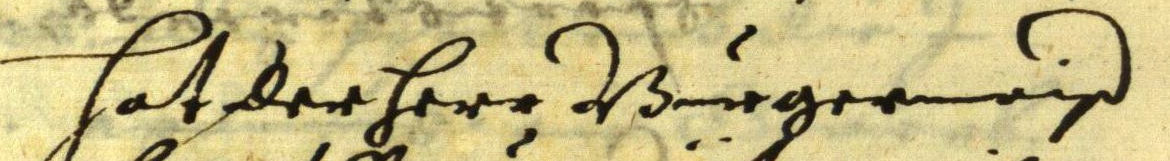hat der herr Būrgermaist
